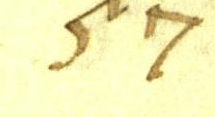57
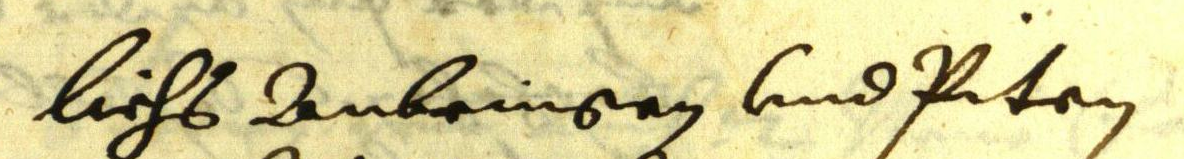lichs Anbringen vnd Piten
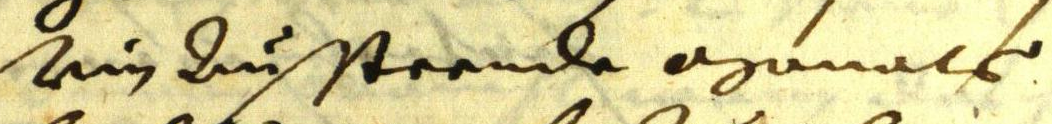sein Aūssteende Monats
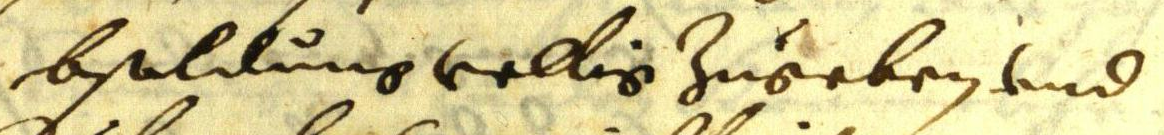besoldūng vellig Zūgeben vnd
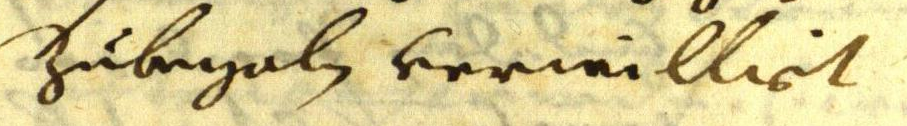Zūbezaln verwilligt.
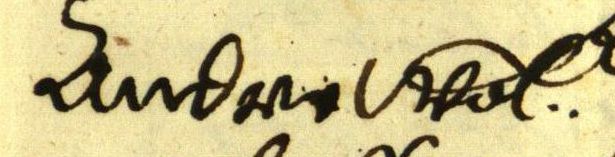Andre Wol¬
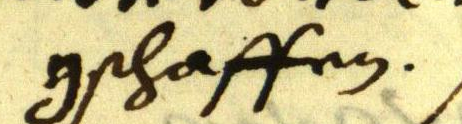gschaffen.
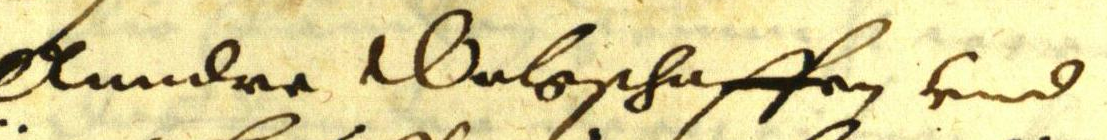Anndre Wolgschaffen vnd
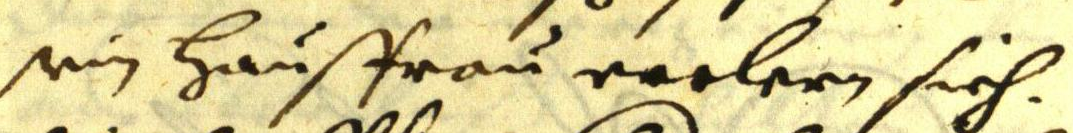sein Haūsfraū erclern sich.
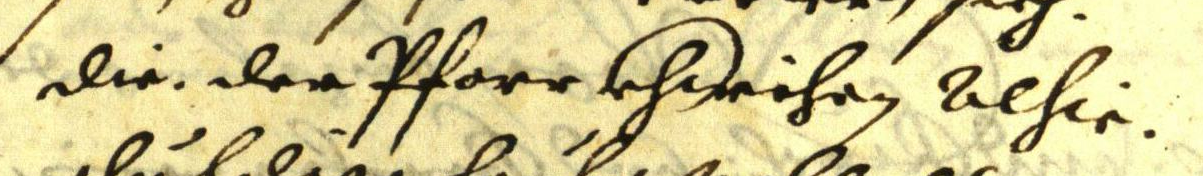die. der Pfarrkhirchen Alhie.
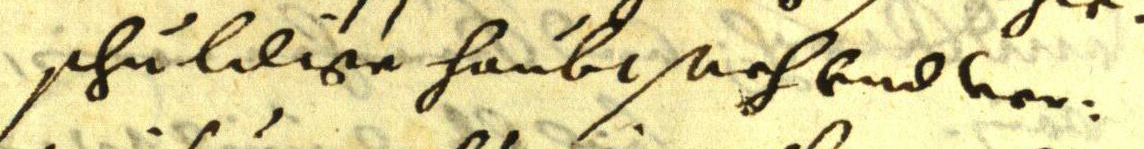schūldigen haūbtsach vnd ver¬
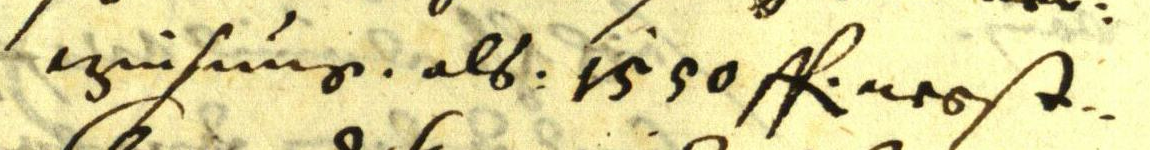zinsūng. als. 1550 fl. negst¬
